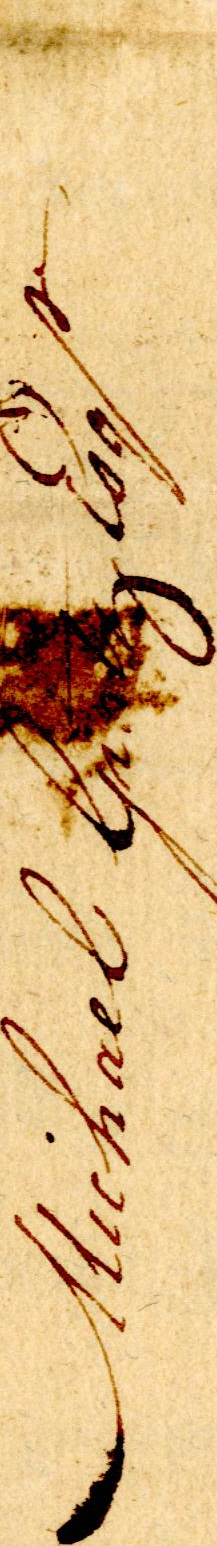Michael Gratz Esq^r
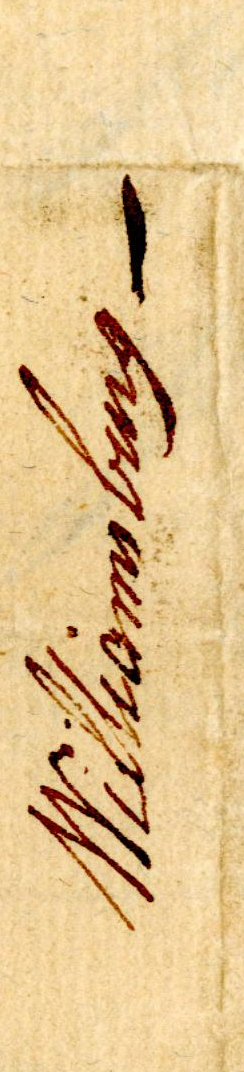Williamsburg
